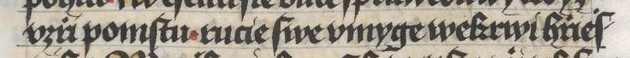vzṙí pomſtu.rucie ſwe vmyge wekrwi hṙieẛ¬
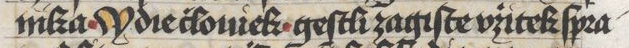níka.Y die člouiek.geſtli zagiſte vżitek ſpra¬
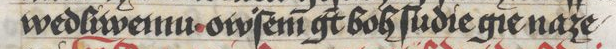wedliwemu.owẛem ḡt boh ſudie gie naze¬
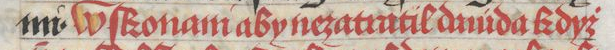mi.Wſkonaní aby nezatratil dauida kdyż
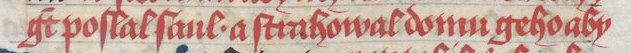ḡt poſlal ſaul.a ſtrahowal domu geho aby
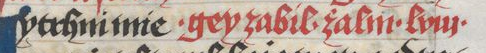ytrhni mie.gey zabil.żalm.lviij.
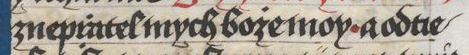znepṙatel mych boże moy.a odtie¬
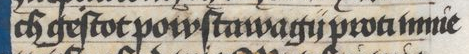ch geẛtot powſtawagij proti mnie
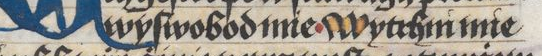wyſwobod mie.Wytrhni mie
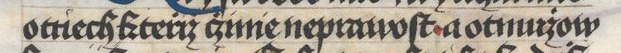ottiech kteṙiż cżinie neprawoſt.a otmużow
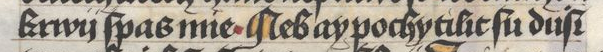krwij ſpas mie.Neb ay pochytilit ſu duẛi
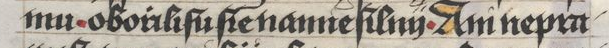mu.oboṙiliſu ſie namie ſilnij.Ani nepra¬
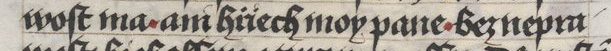woſt ma.ani hṙiech moy pane.bez nepra¬
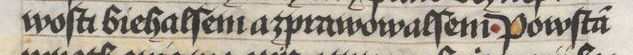woſti biehalſem a zprawowalſem.Powſtā
